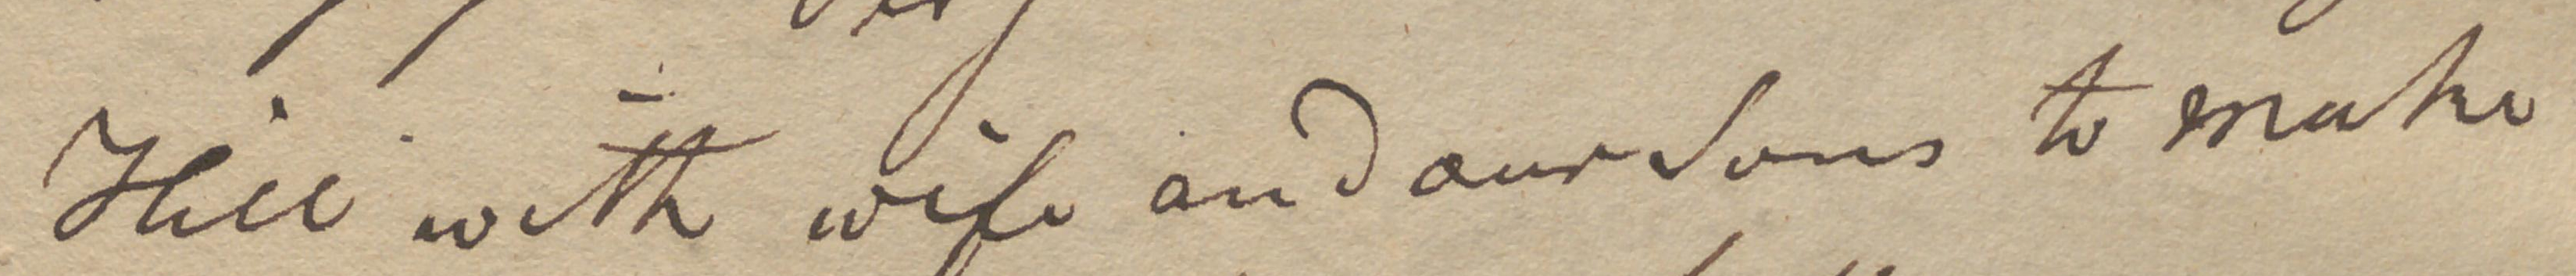Hill with wife and our sons to make
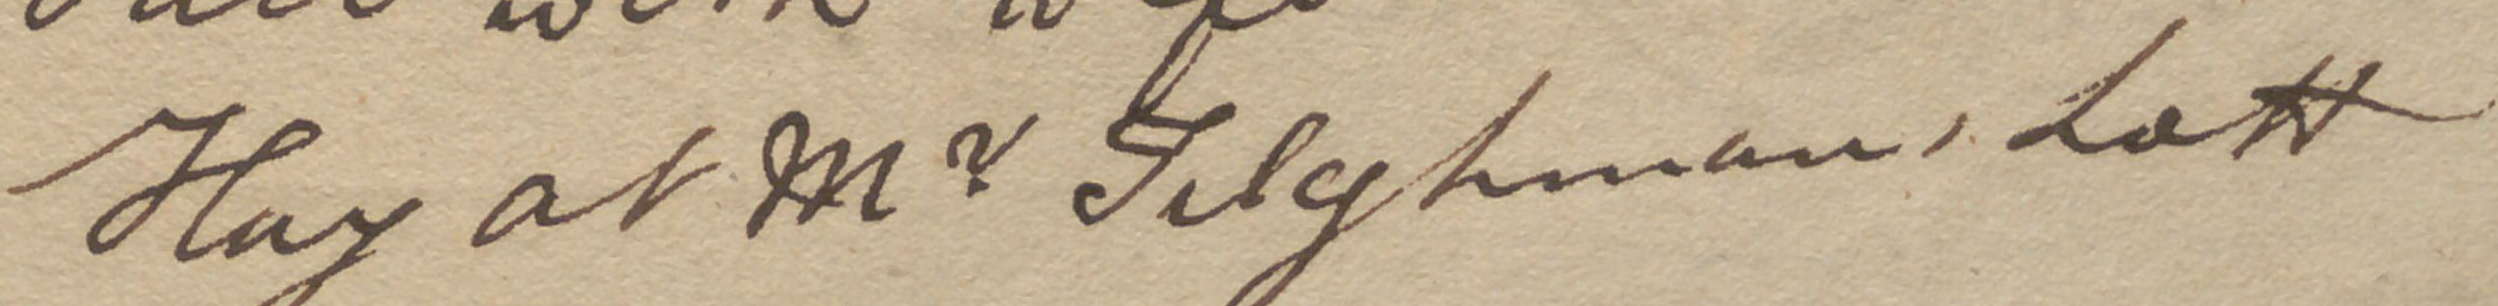Hay at M^r. Tilghmans Lott
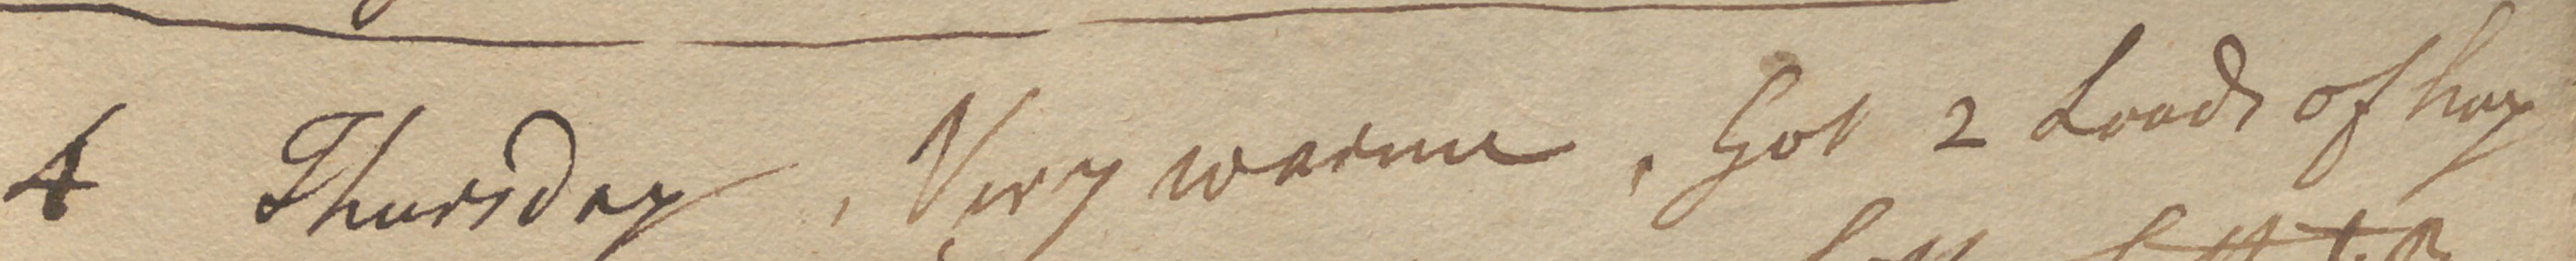4 Thursday, Very warme, Got 2 Loads of hay
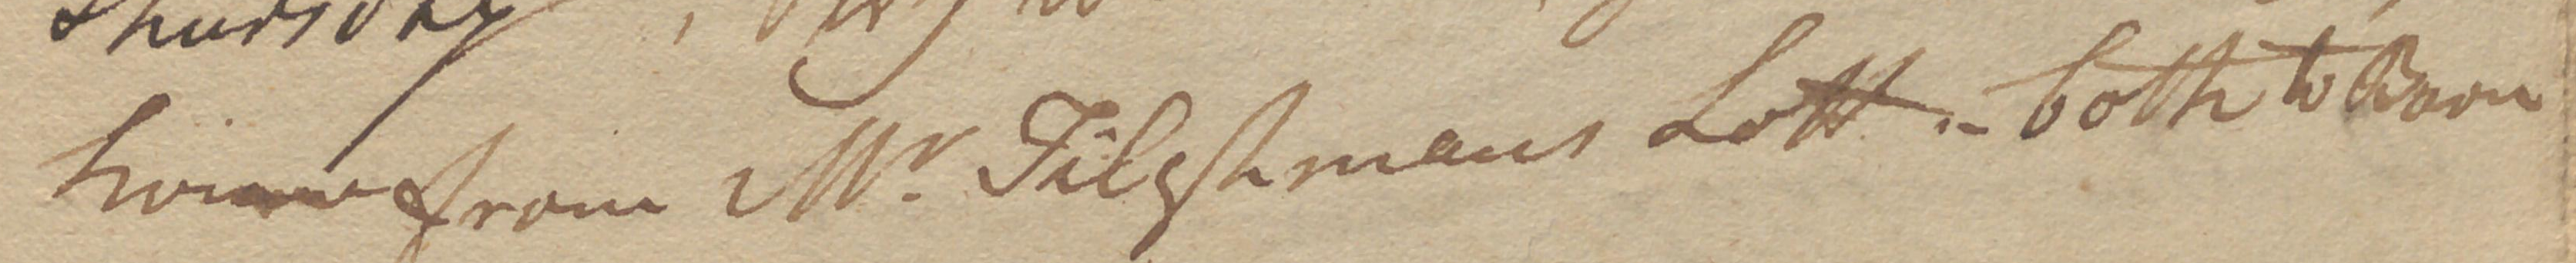home from M^r. Tilghmans Lott both to Barn
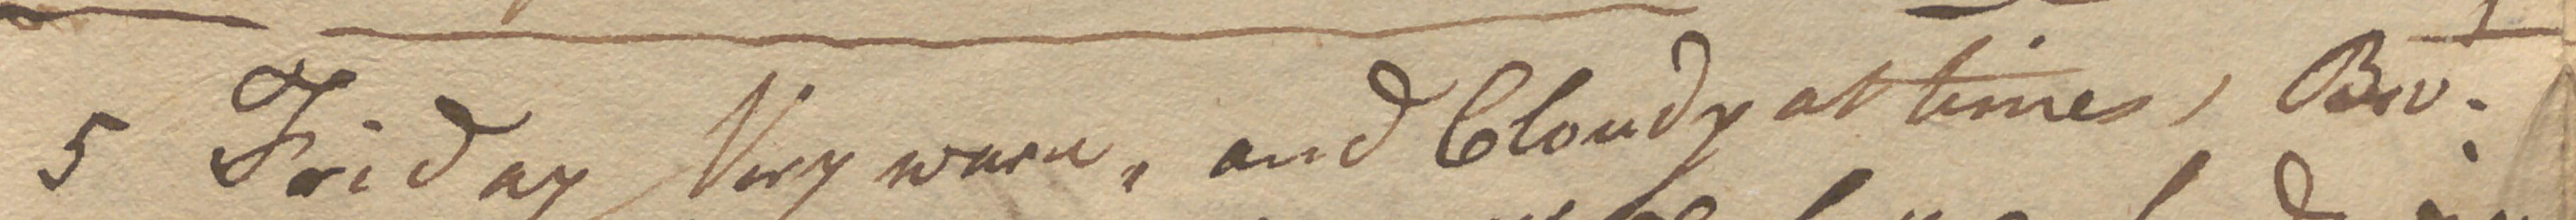5 Friday Very warm, and Cloudy at times, Bro^t.
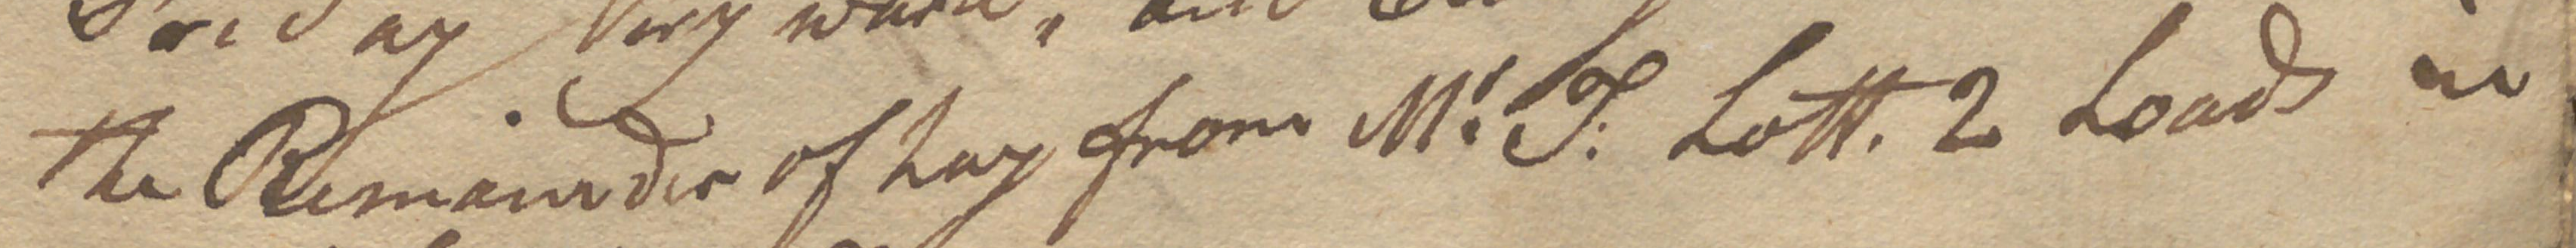the Remaider of hay from M^r. T. Lott. 2 Loads in
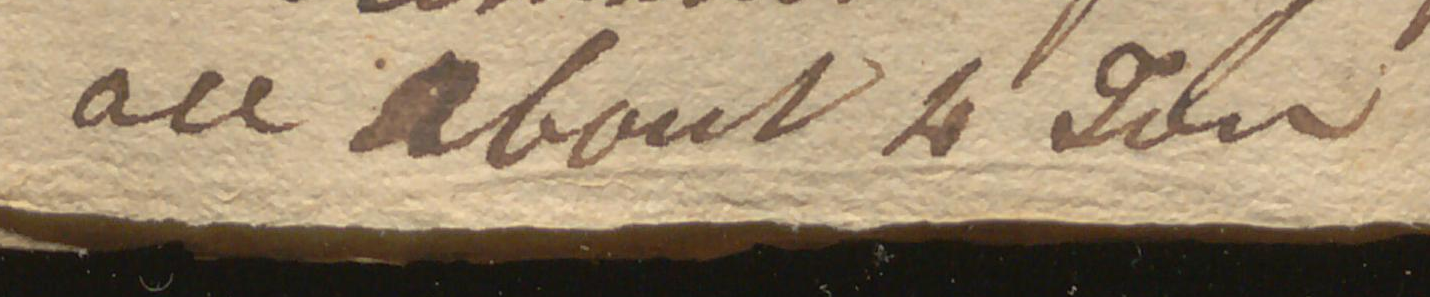all About 4 Ton
